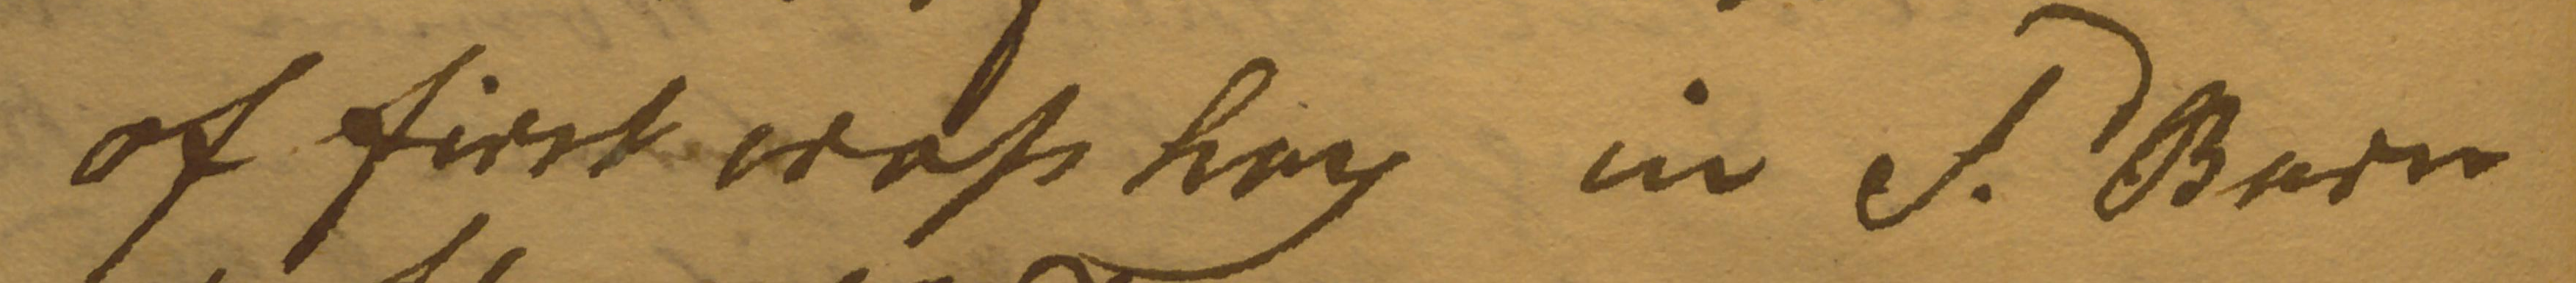of first crop hay in S^d. Barn
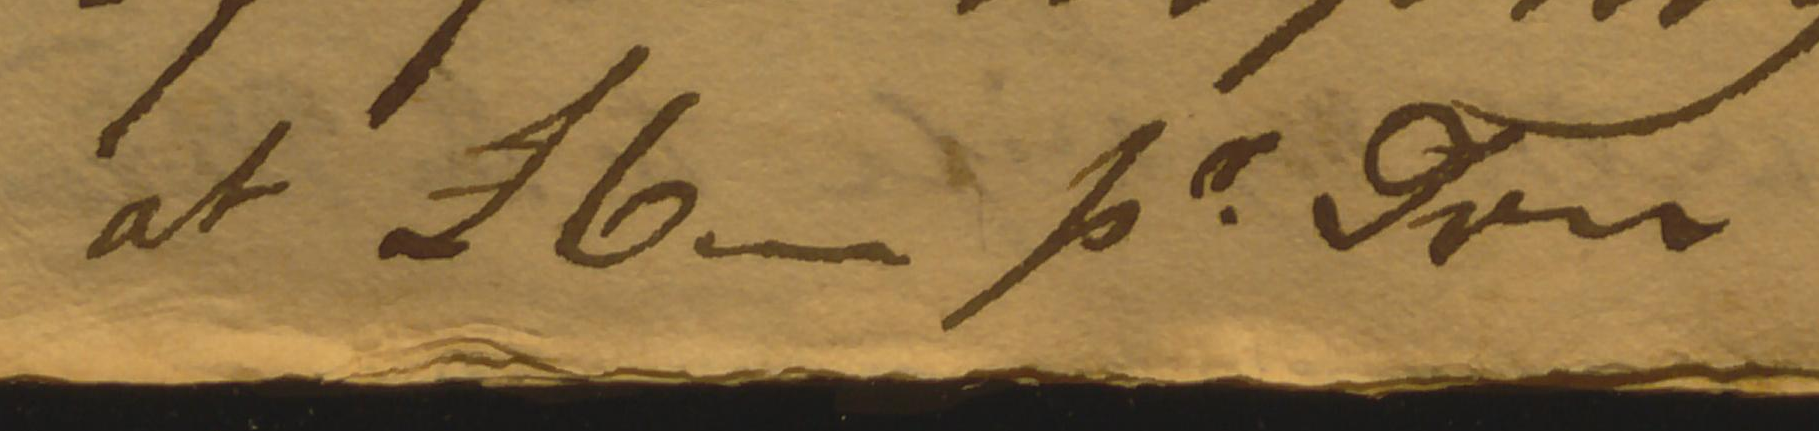at £16- p^r. Ton
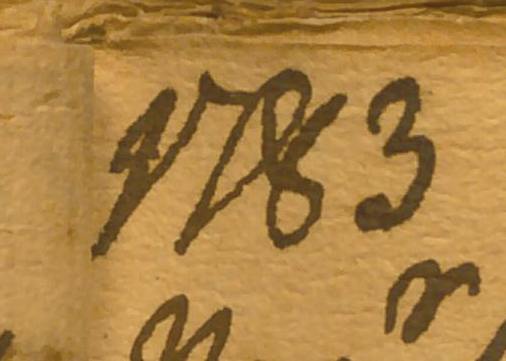1783
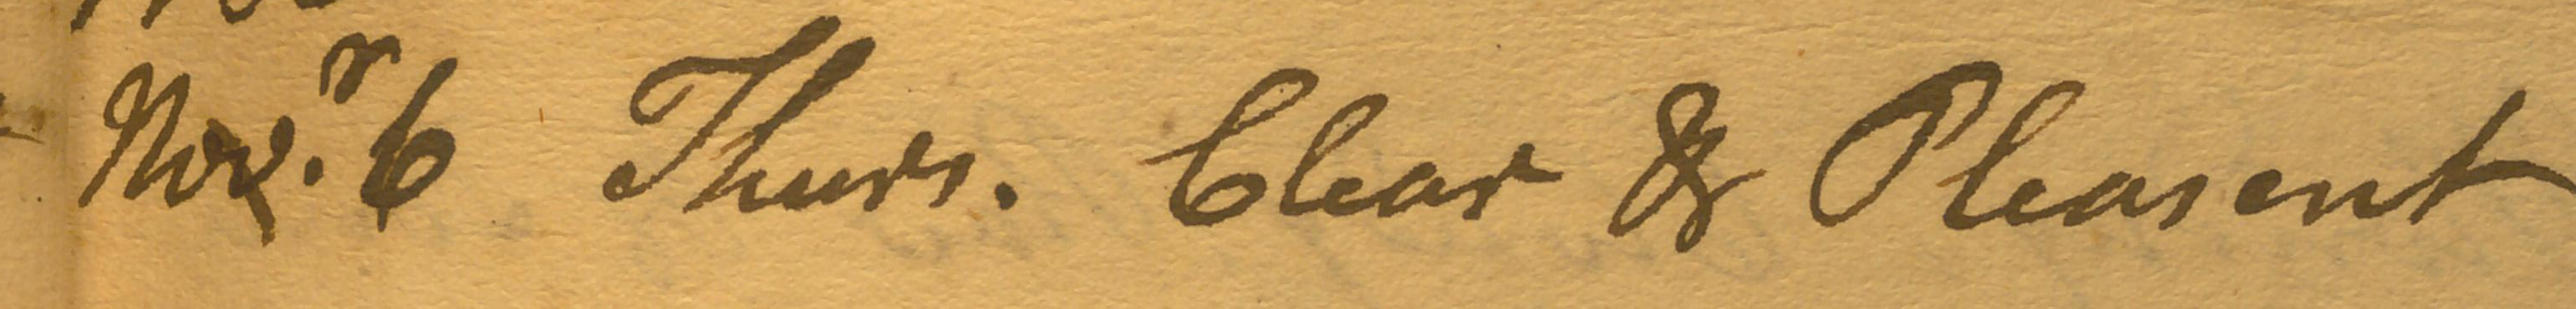Nov^r. 6 Thurs. Clear & Pleasent
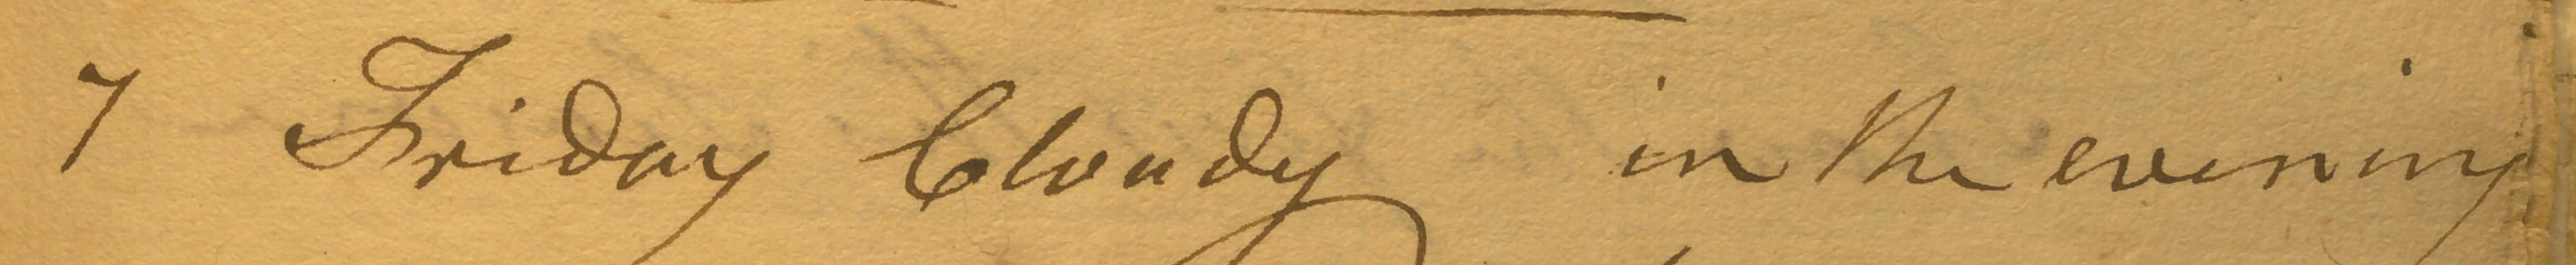7 Friday Cloudy in the evening
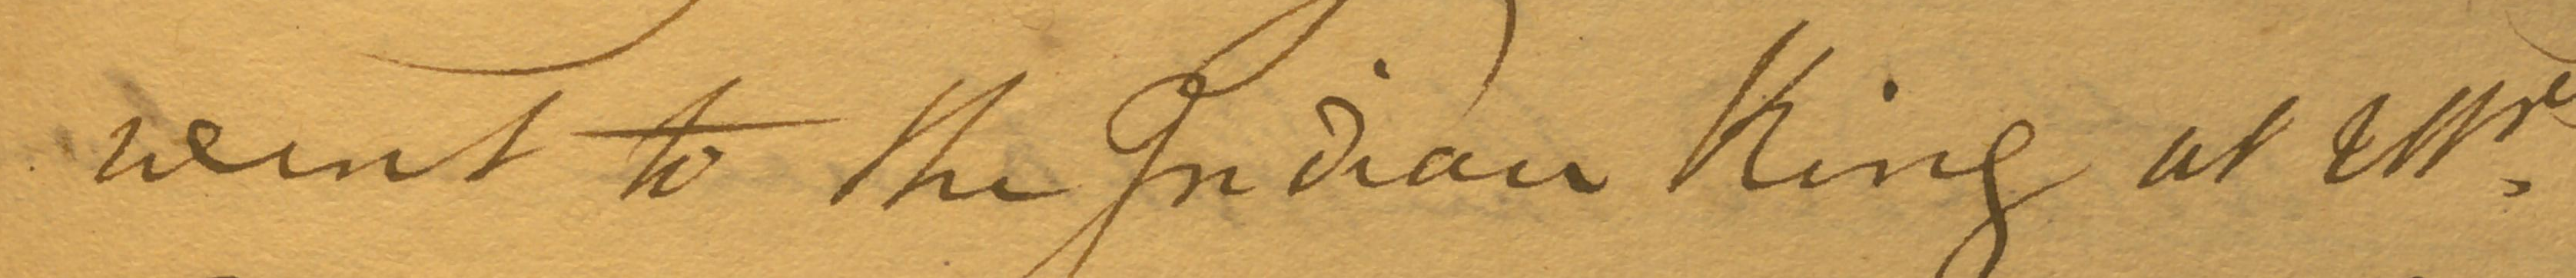went to the Indian Hing at M^rs.
